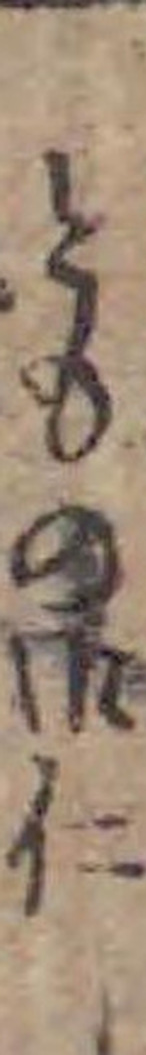ともの御仁
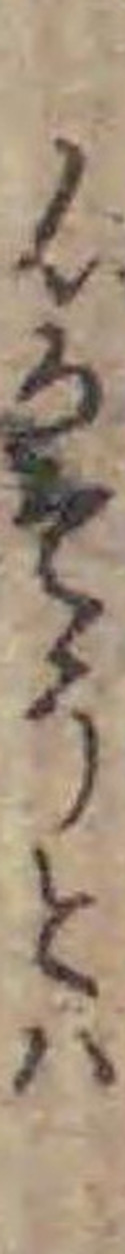心かそうとは
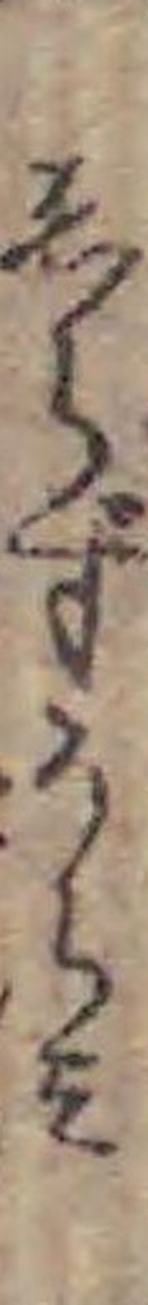しらずうらみ
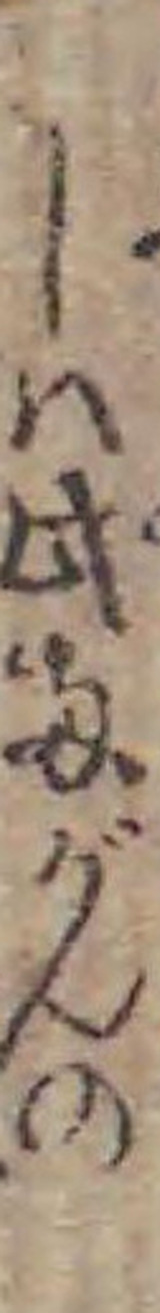しは此両がんの
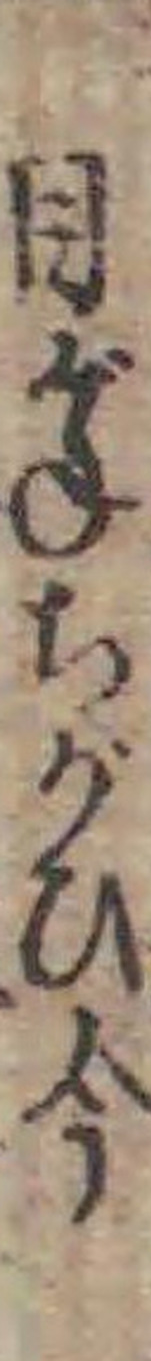目がねちがひ今
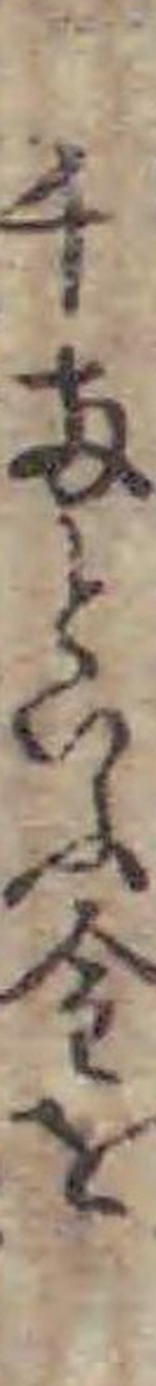千両といふ金を
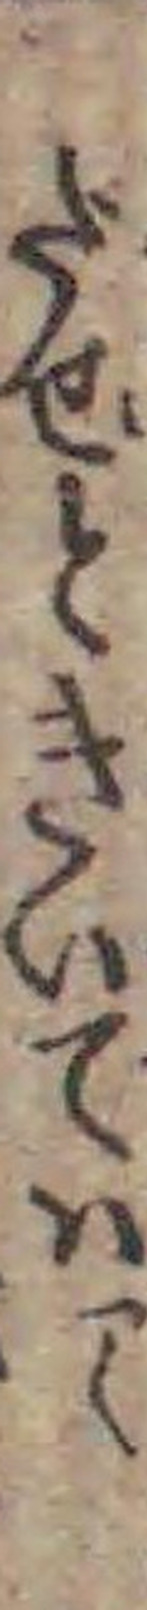だせときいてはアヽ
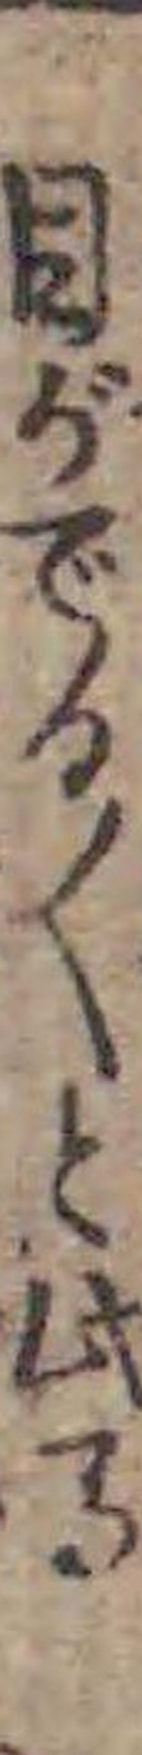目がでる〳〵と此馬
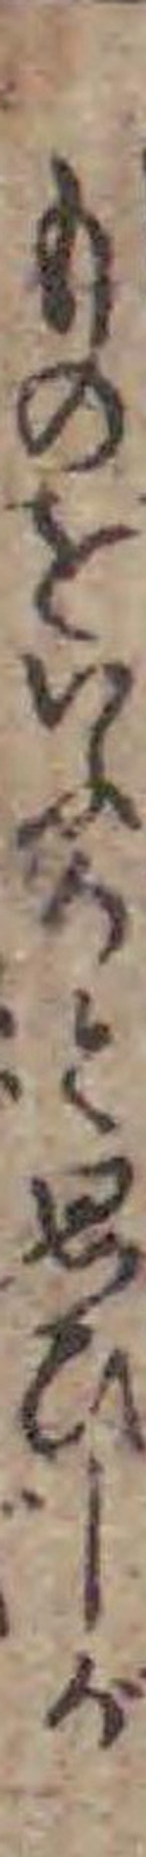ものをいふかと思ひしが
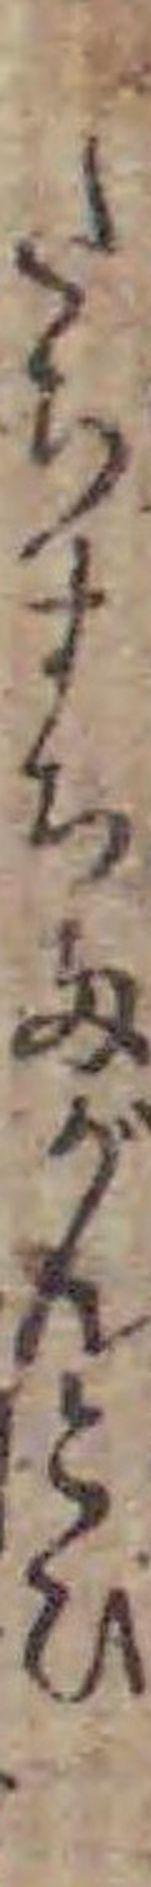たちまち両がんとび
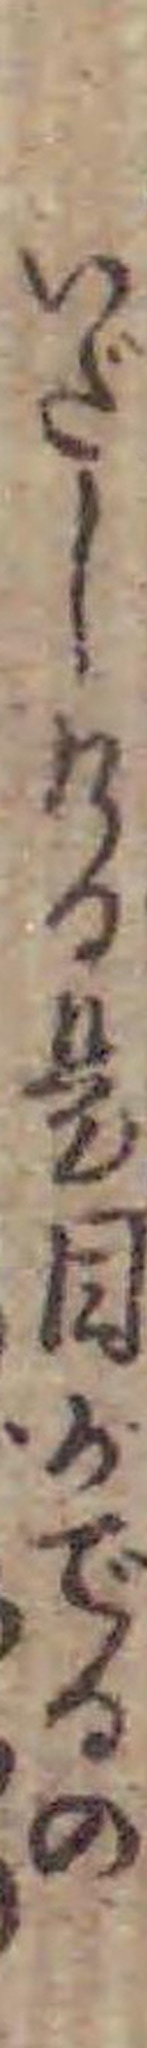いだしける是目がでるの

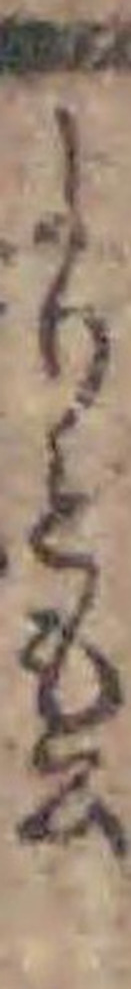よりとも公
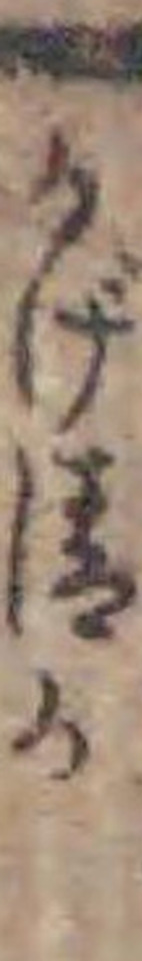かげ清か
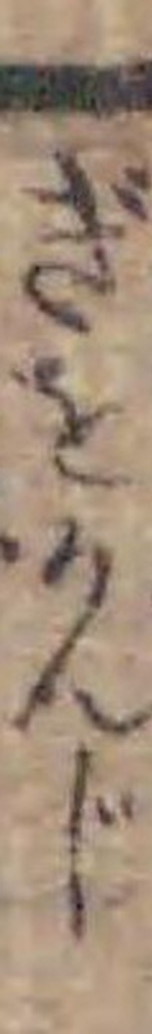ぎをかんじ
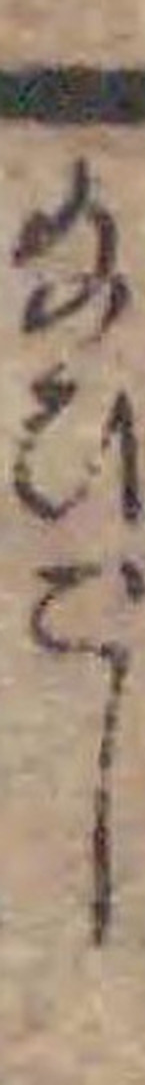給ひごし
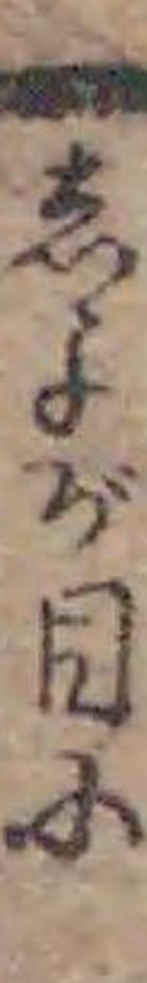しよが目に
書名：悪七変目景清 : 2巻
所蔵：国立国会図書館 National Diet Library, JAPAN
